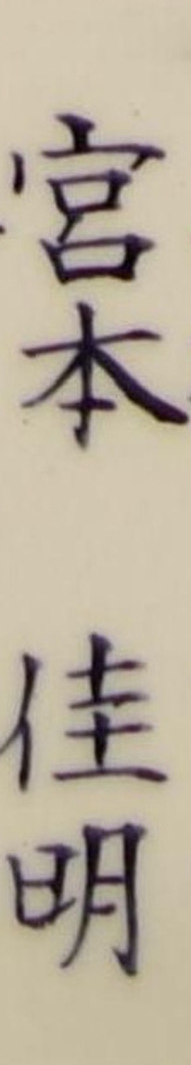宮本佳明
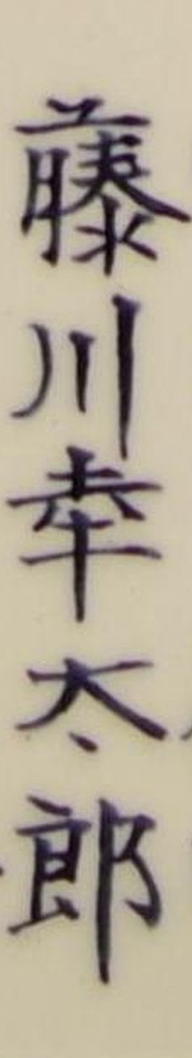藤川幸太郎
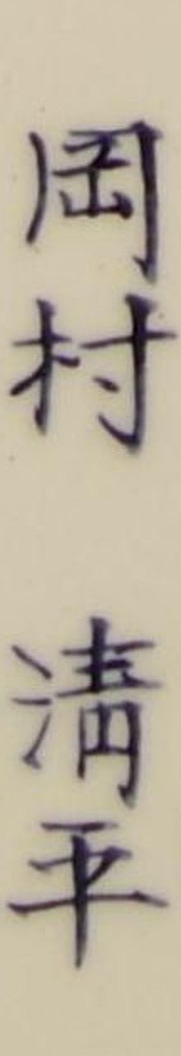岡村清平
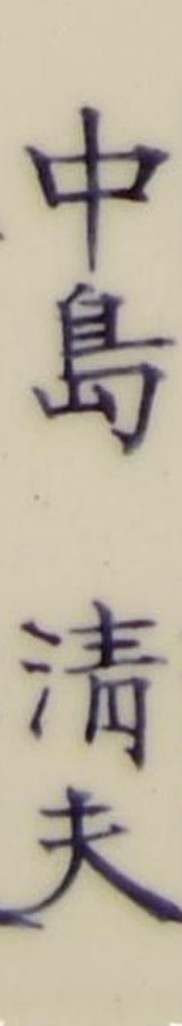中島清夫
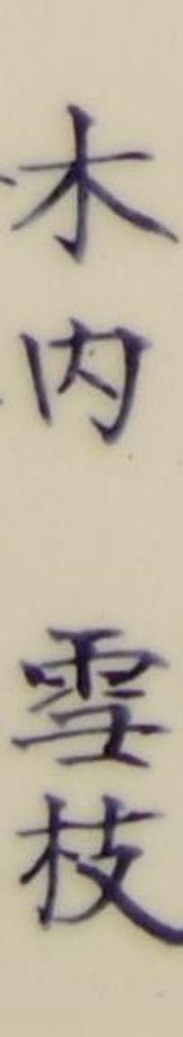木内雪枝
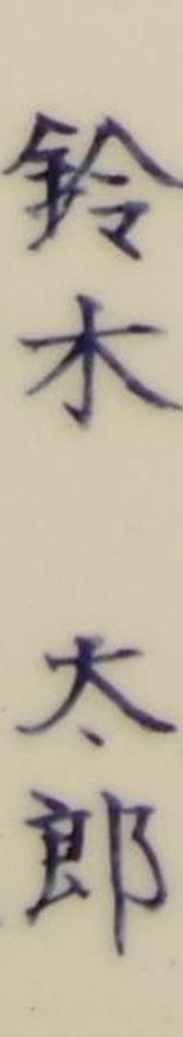鈴木太郎
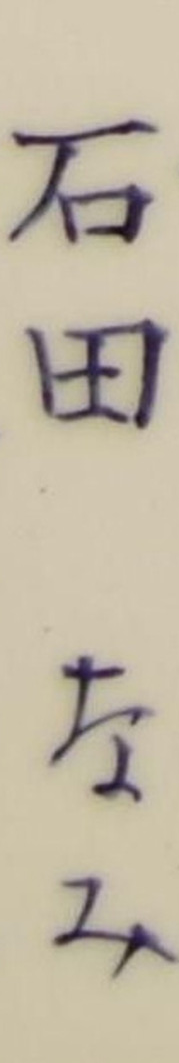石田なみ
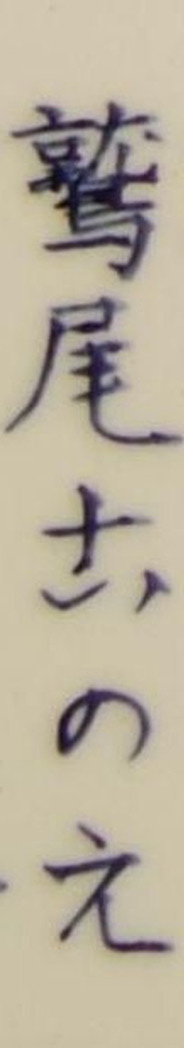鷲尾このえ
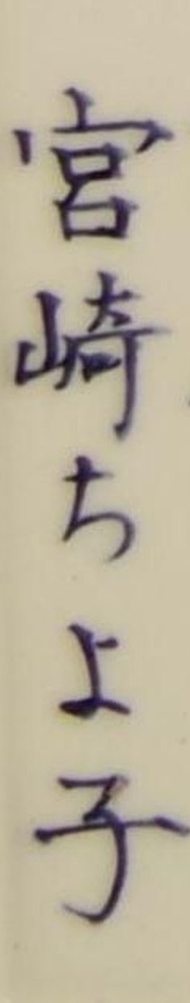宮崎ちよ子

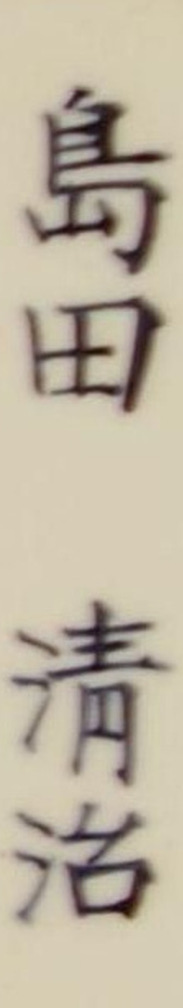島田清治
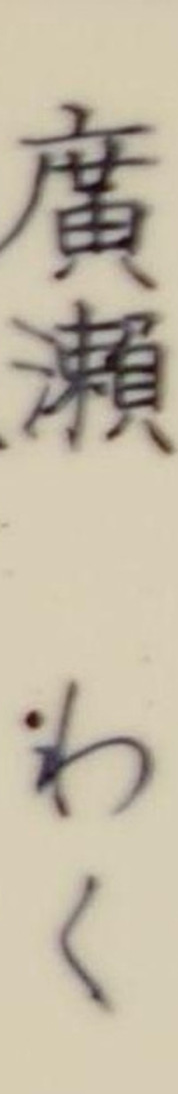廣瀬わく
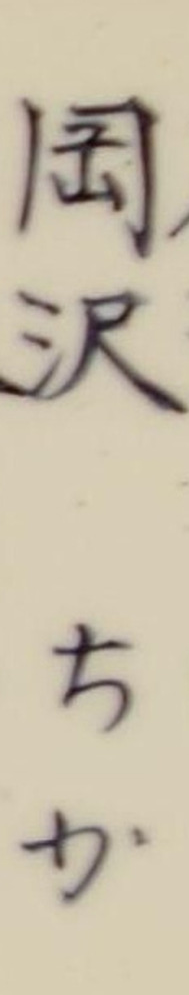岡沢ちか
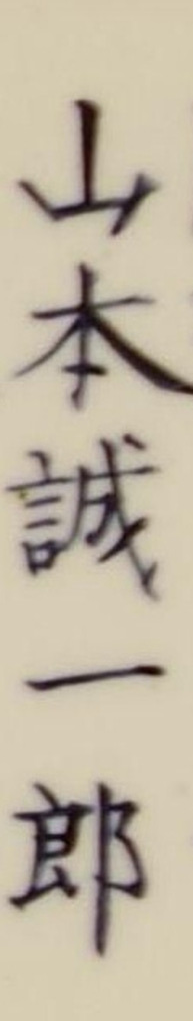山本誠一郎
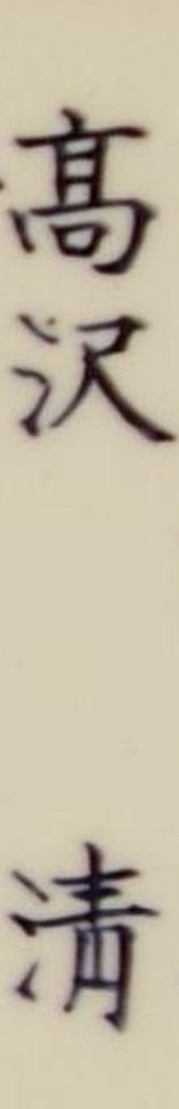高沢清
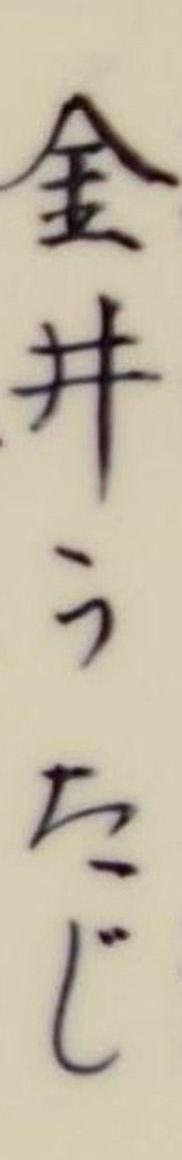金井うたじ
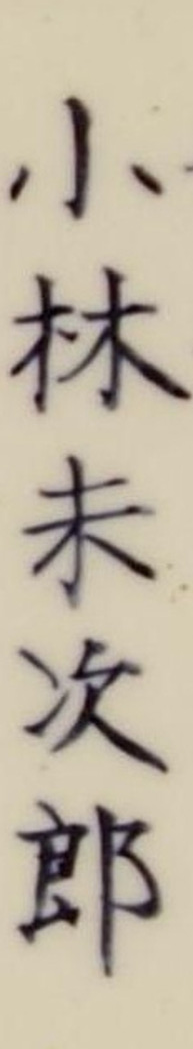小林未次郎
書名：A~D
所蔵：koyasan kongobuji
